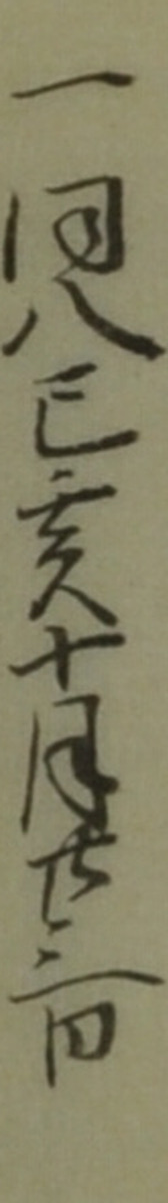一同八己亥十月廿三日
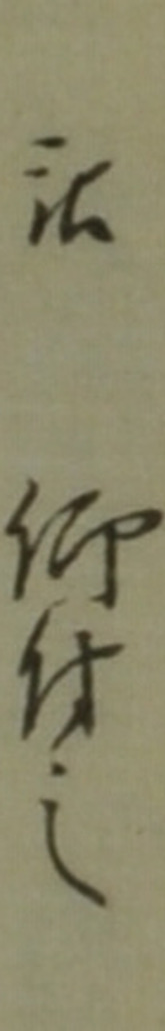被仰付之
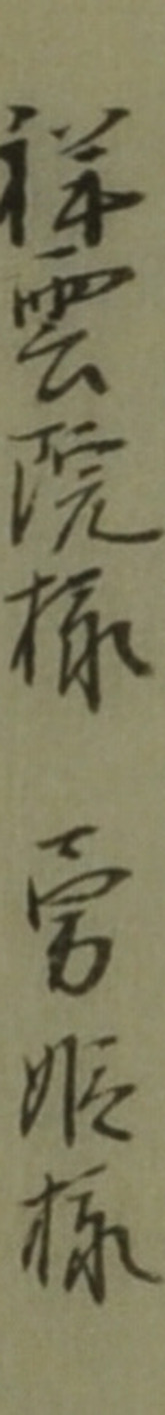祥雲院様勇姫様
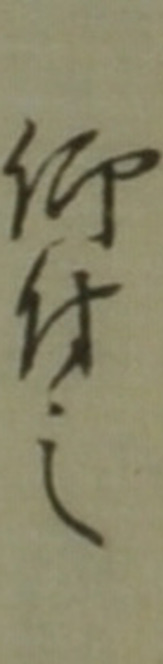仰付之
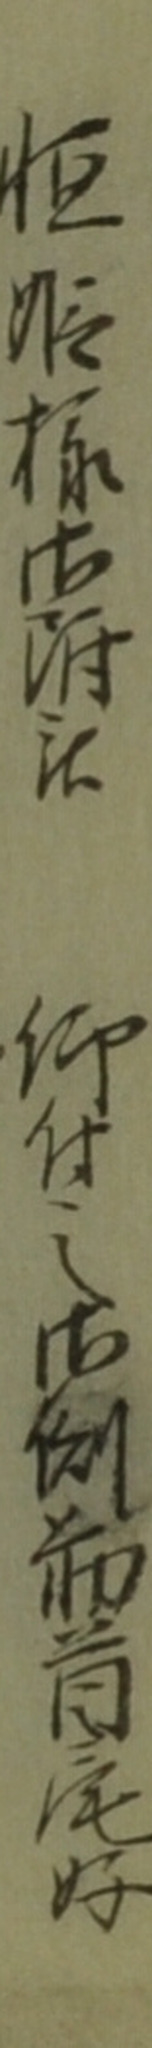恒姫様御附被仰付之御側勤首尾好
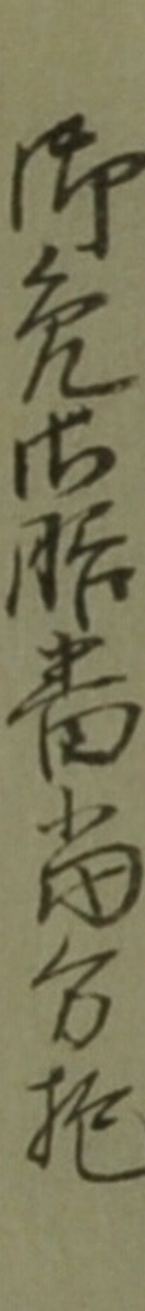御免御膳番当分抱
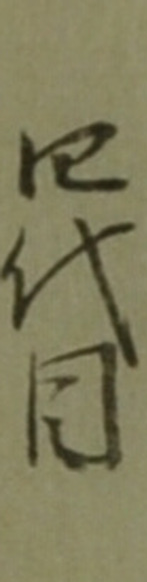四代目
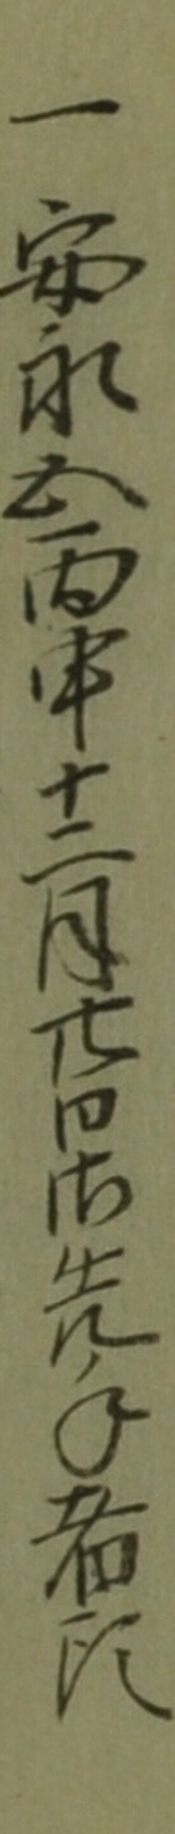一安永五丙申十二月廿日御先手者頭
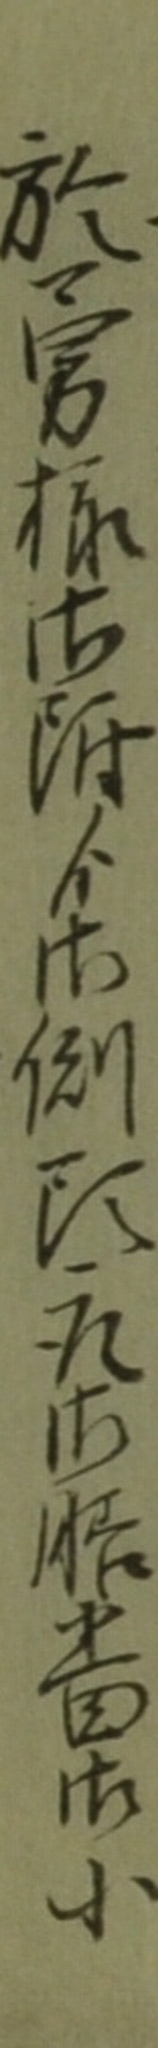於勇様御附ゟ御側頭取御膳番御小
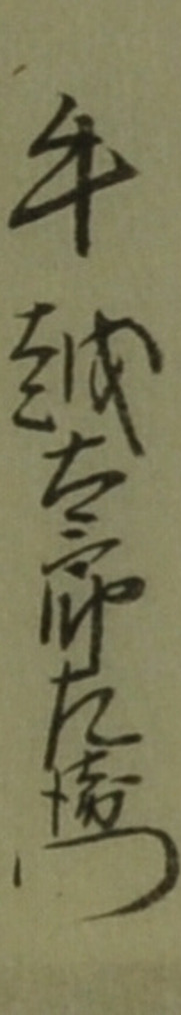牛越太郎左衛門
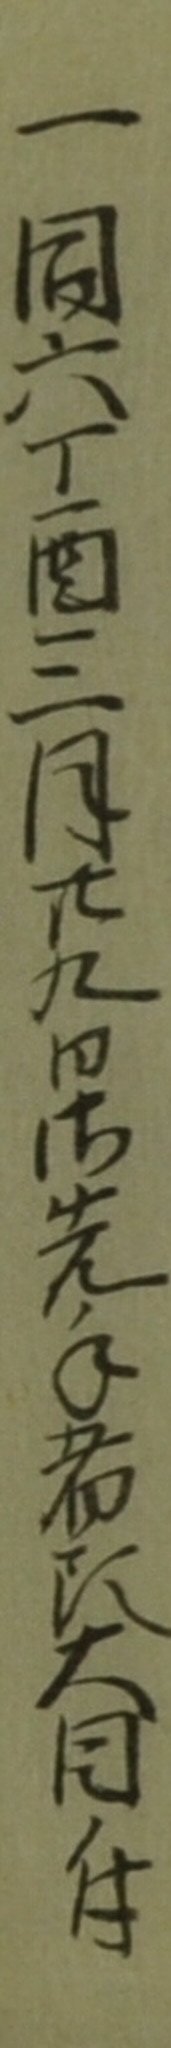一同六丁酉三月廿九日御先手者頭大目付
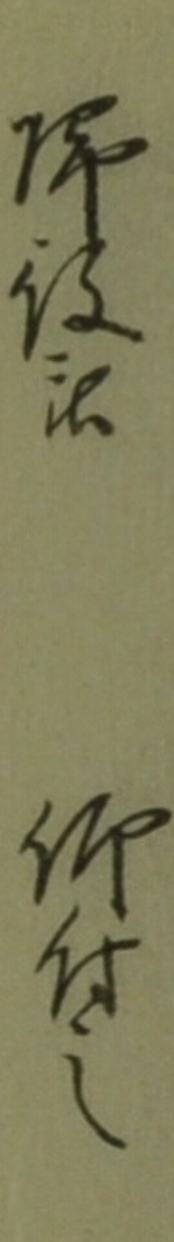帰役被仰付之
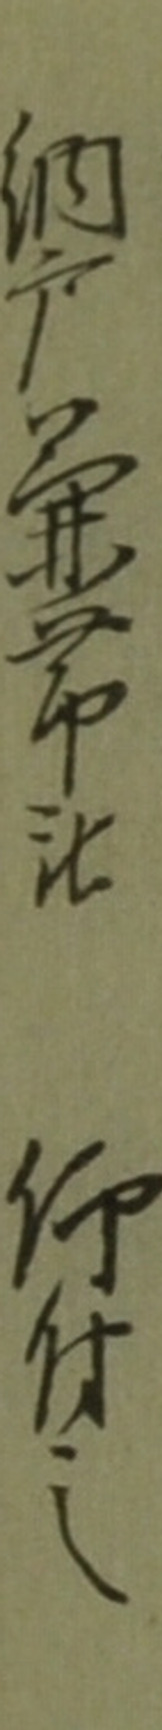納戸兼帯被仰付之
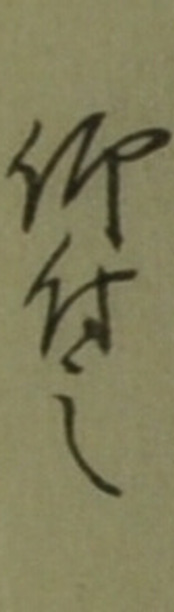仰付之

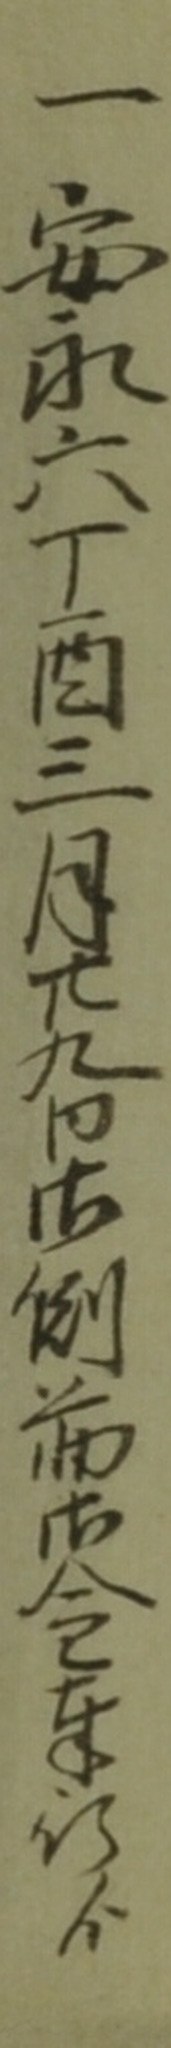一安永六丁酉三月廿九日御側勤御金奉行ゟ
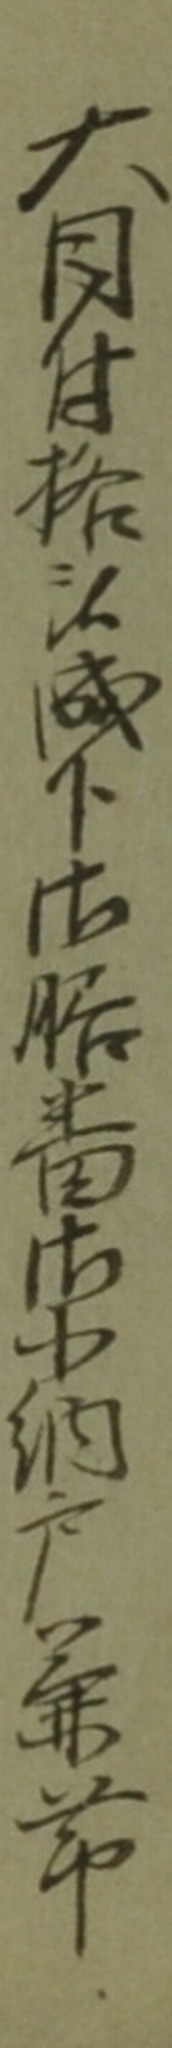大目付格被成下御膳番御小納戸兼帯
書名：諸御役代々録（四）
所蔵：伊那市立高遠町図書館・合同会社AMANE
